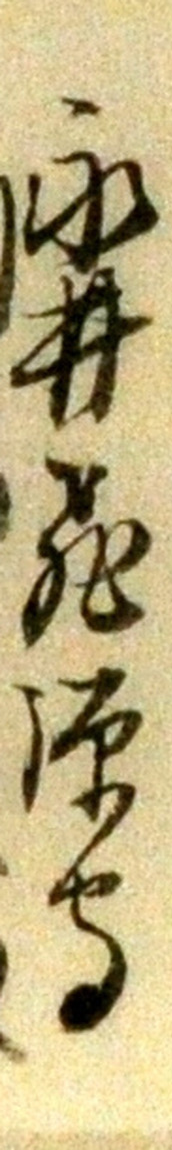永井飛騨守
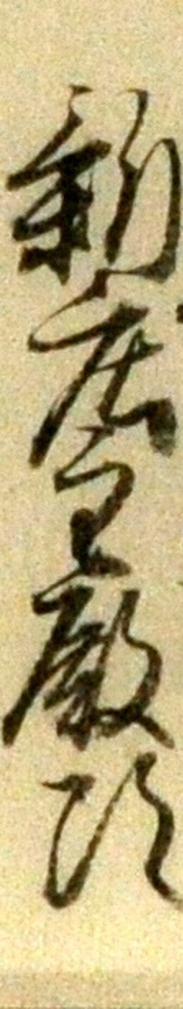新庄主殿頭
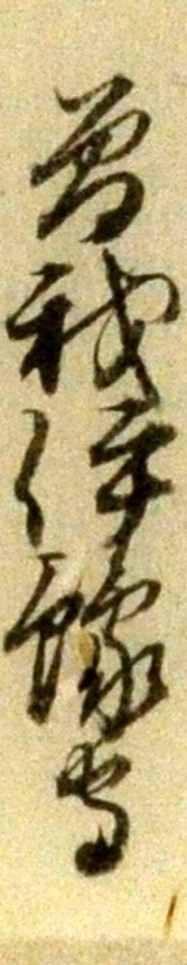曽我伊予守
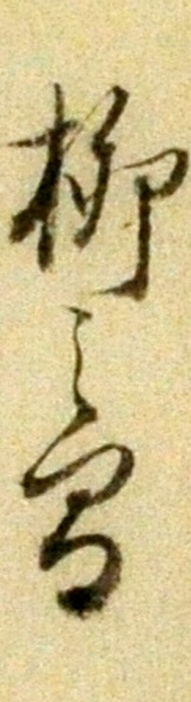柳之間

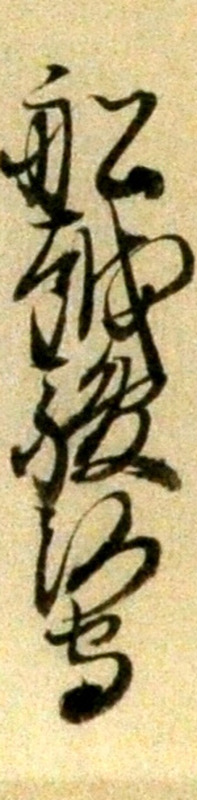船越駿河守
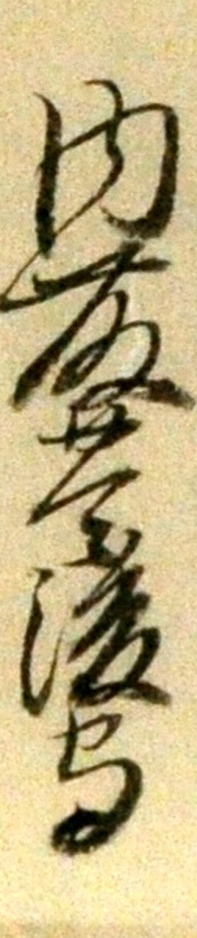内藤豊後守
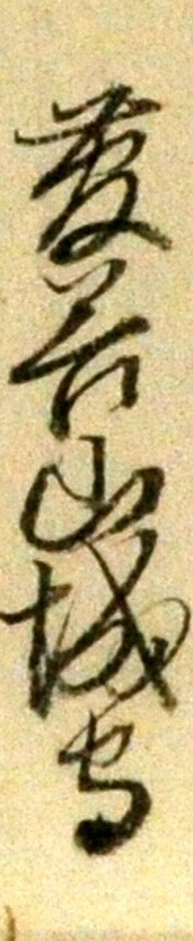菅谷山城守
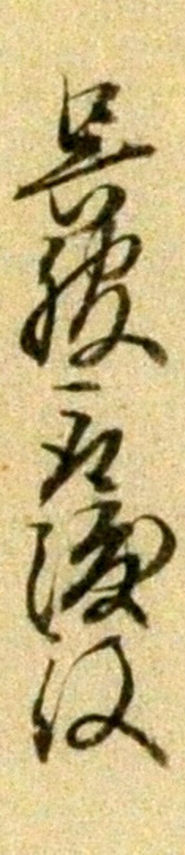呉服取渡役
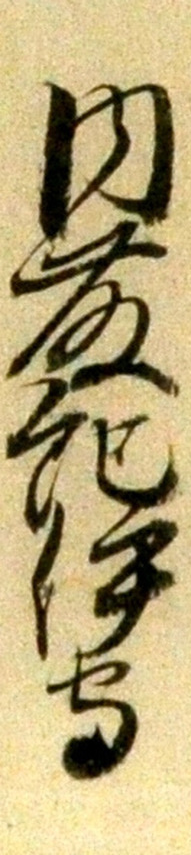内藤紀伊守
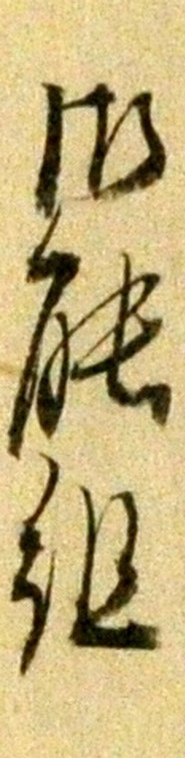御能組
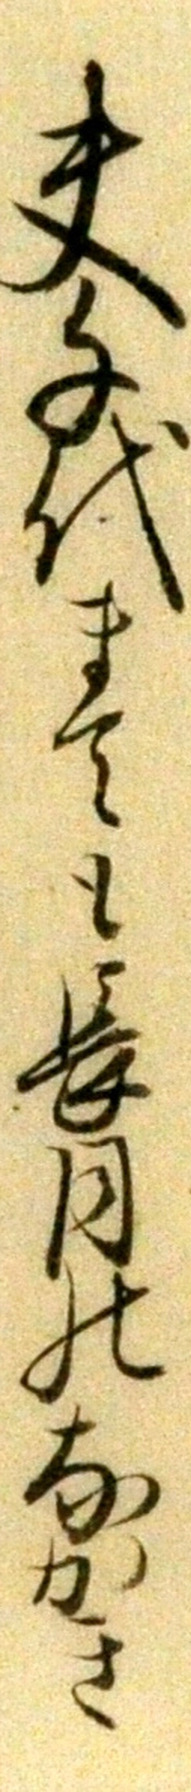夫千代まても長月のなかき
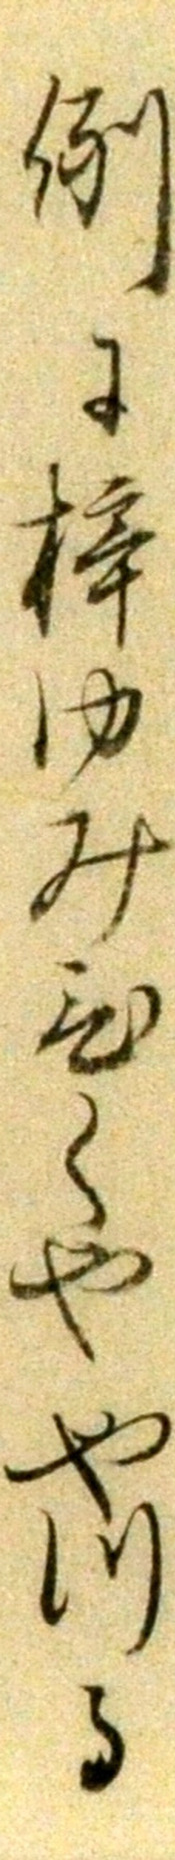例に梓ゆみひくややつる
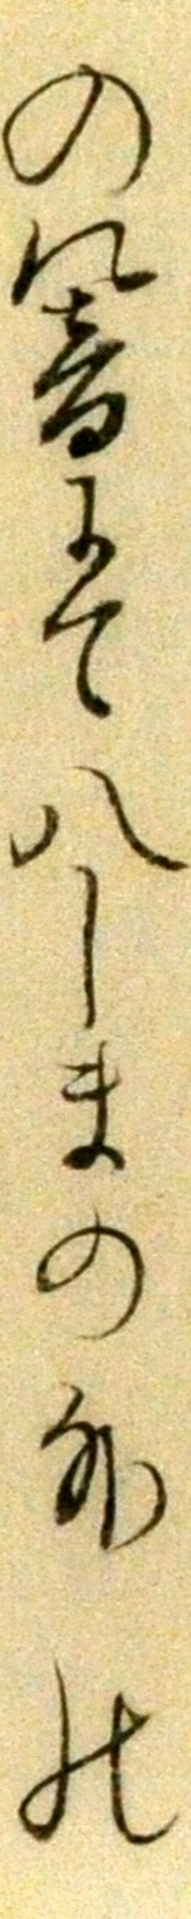の響にて八しまの外の
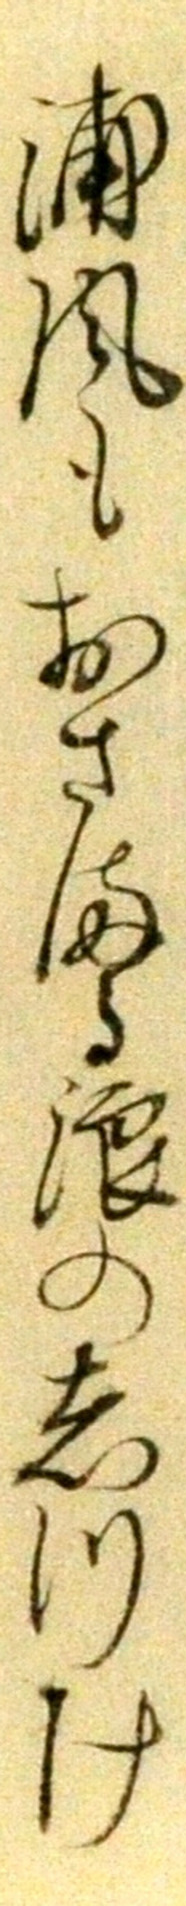浦風もおさまる浪のしつけ
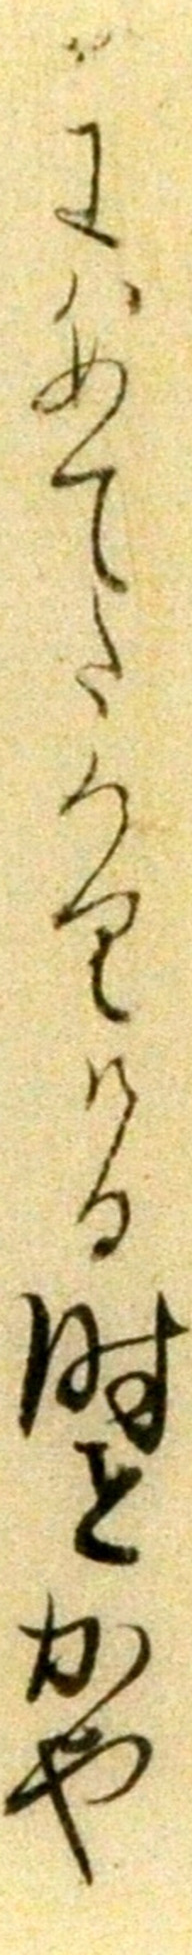さハめてたかりける時とかや
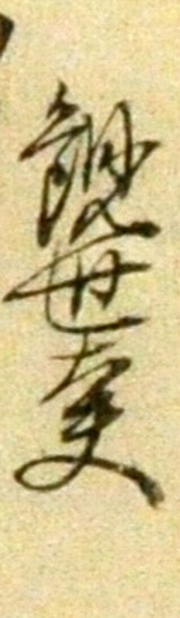観世大夫
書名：御馳走御能ノ節ノ留外
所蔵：伊那市立高遠町図書館・合同会社AMANE
